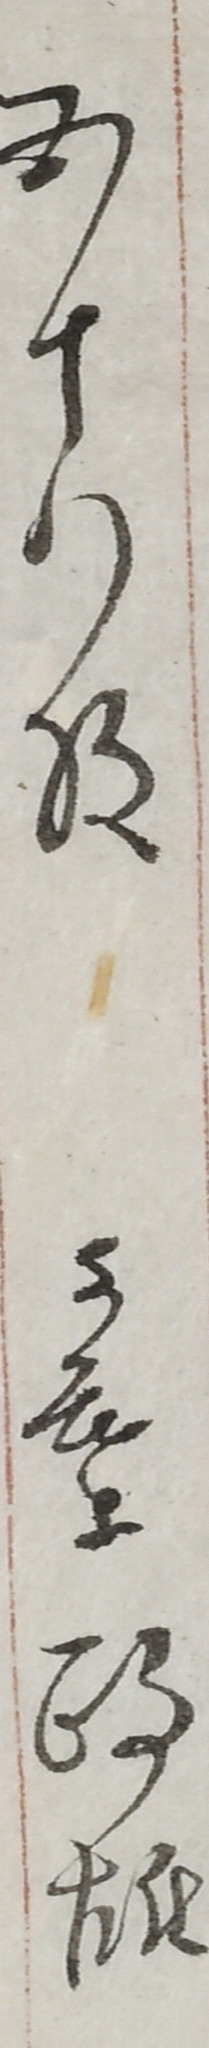五十八枚千葉政雄
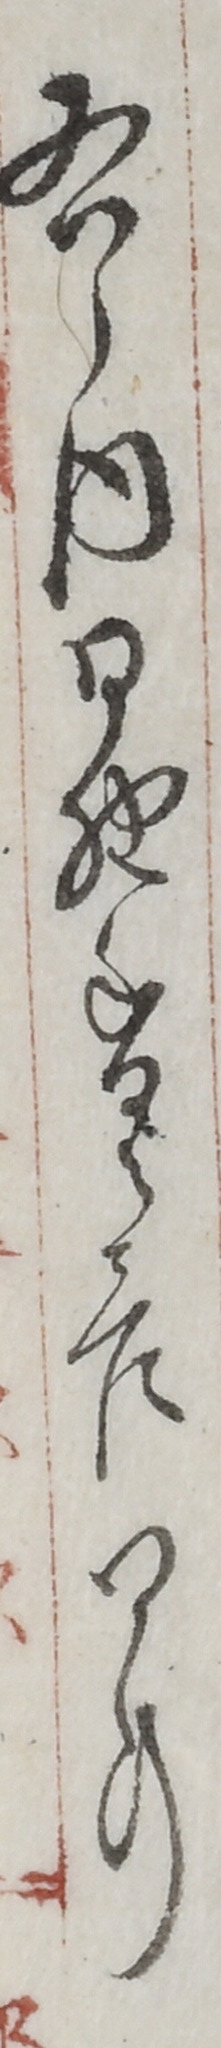右之内日野香之彦同断

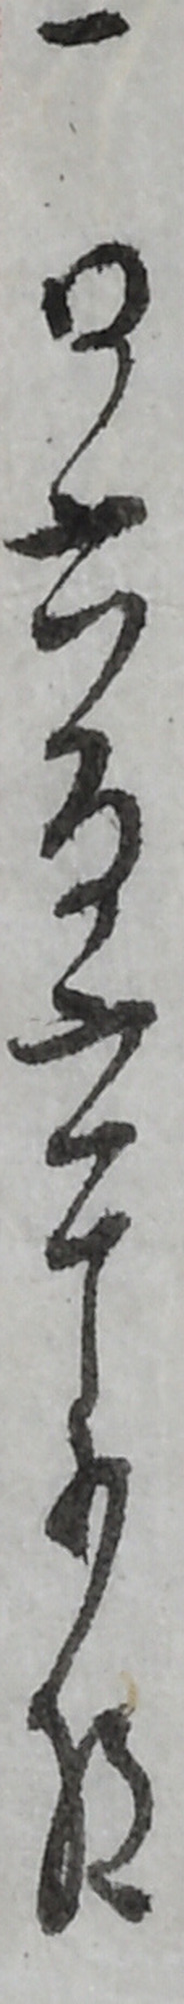一同六百六十五枚
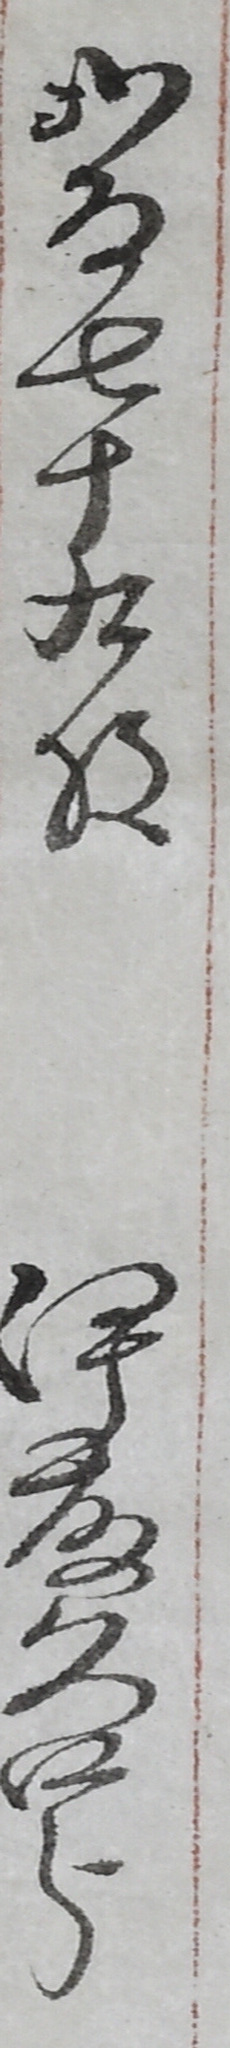弐百七十九枚伊藤久四郎
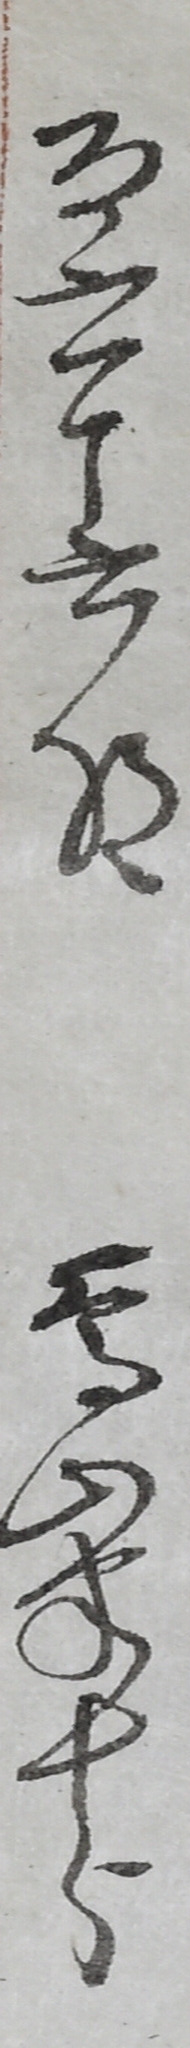百六十六枚鳥山半十郎
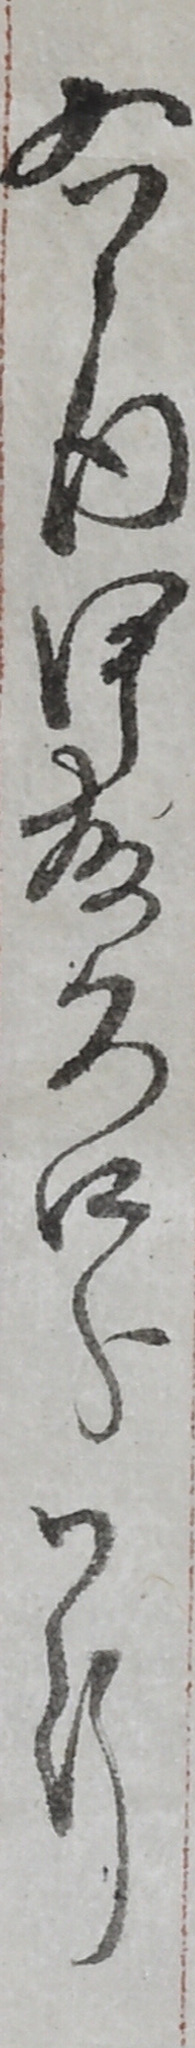右之内伊藤久四郎同断
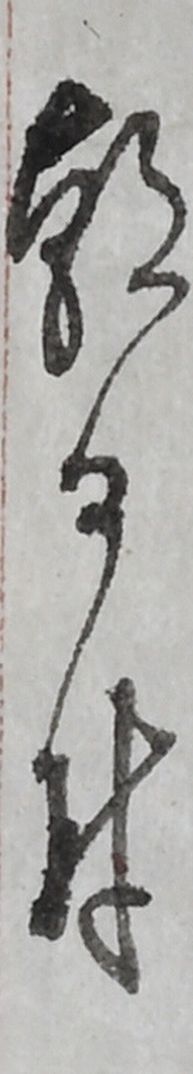朝日村
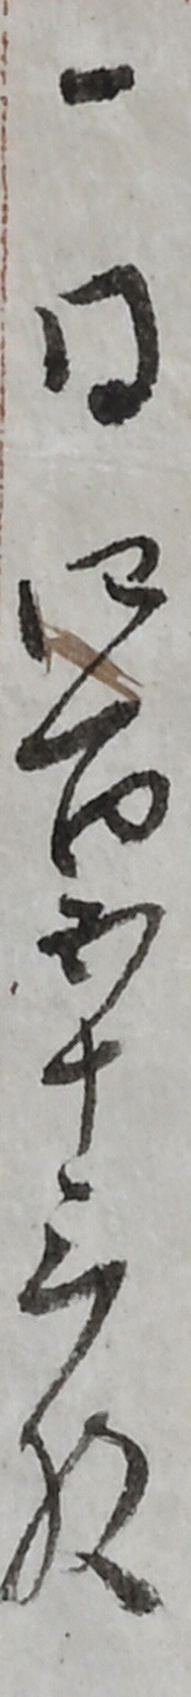一同四百五十三枚
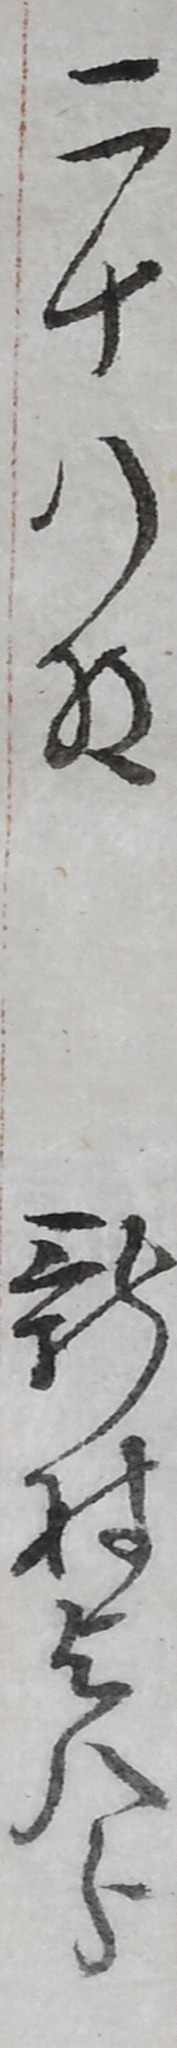二十八枚新村与八郎
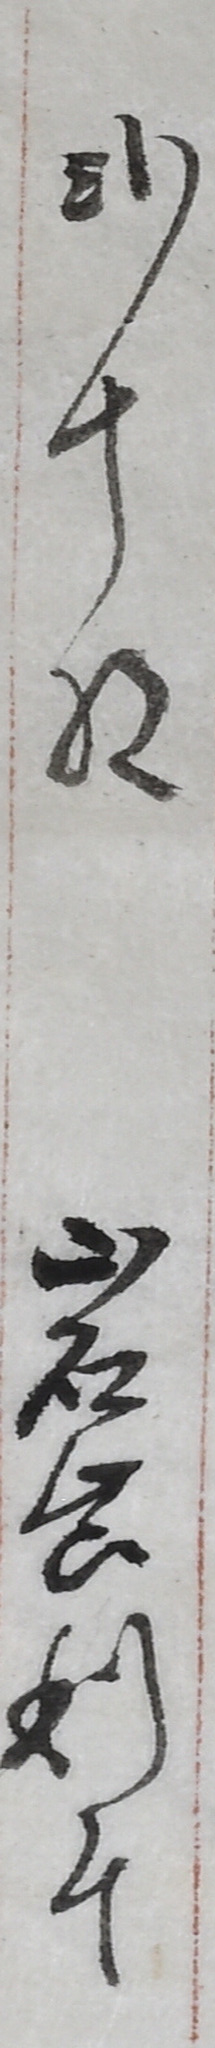弐十枚岩垂利十
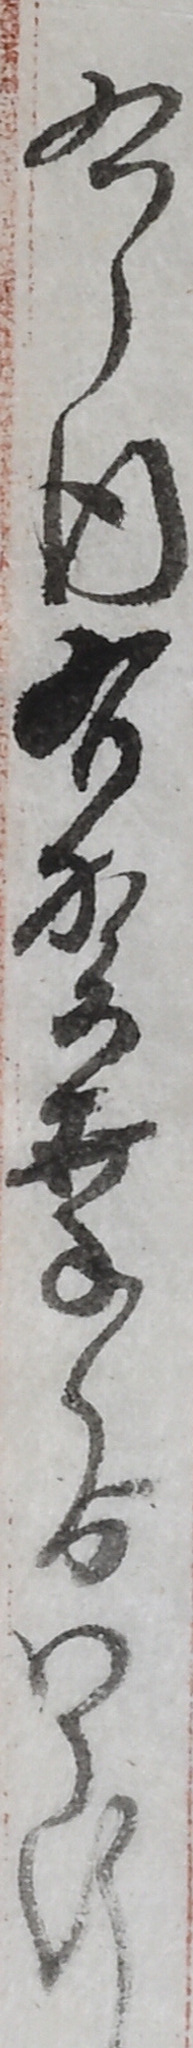右之内有賀幸右衛門同断
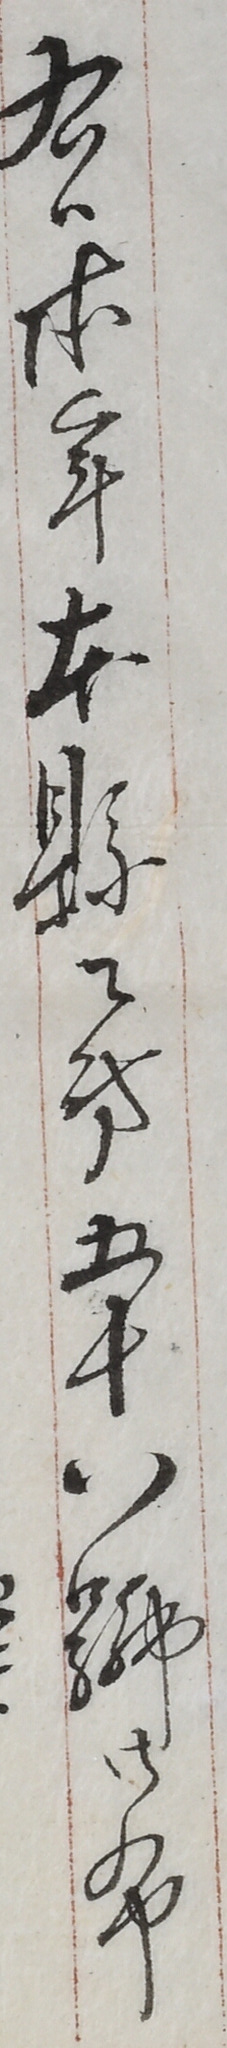右ハ本年本県ニ第五十八号之節
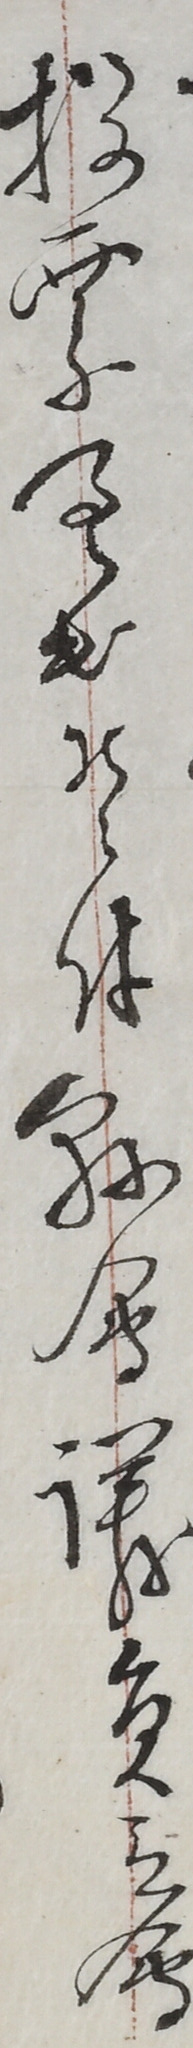投票等へ出候付県会議員壱会
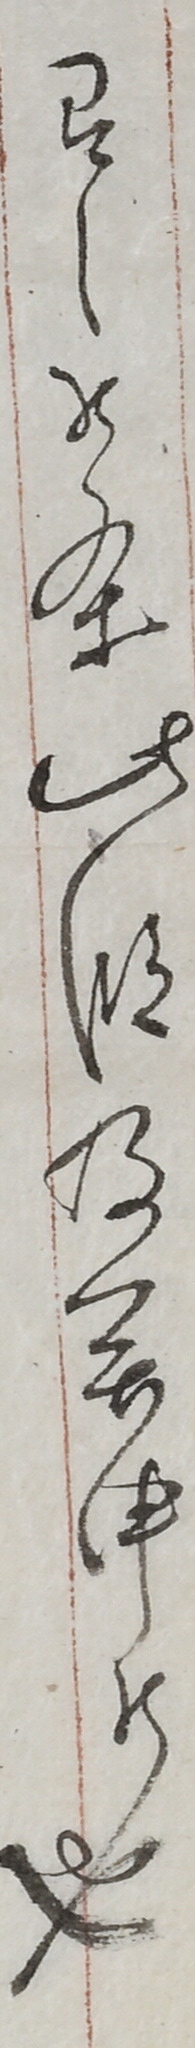有之候条此段及并申候也
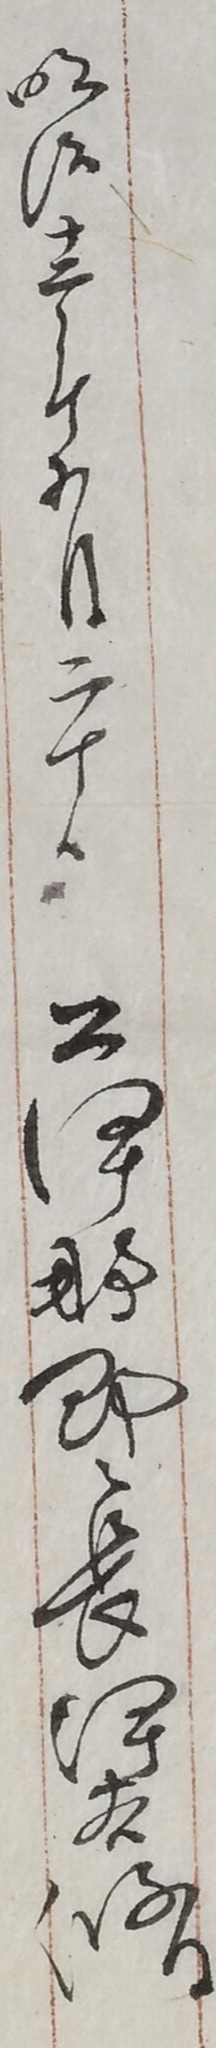明治十二月二十月二十日上伊那郡々長伊谷修

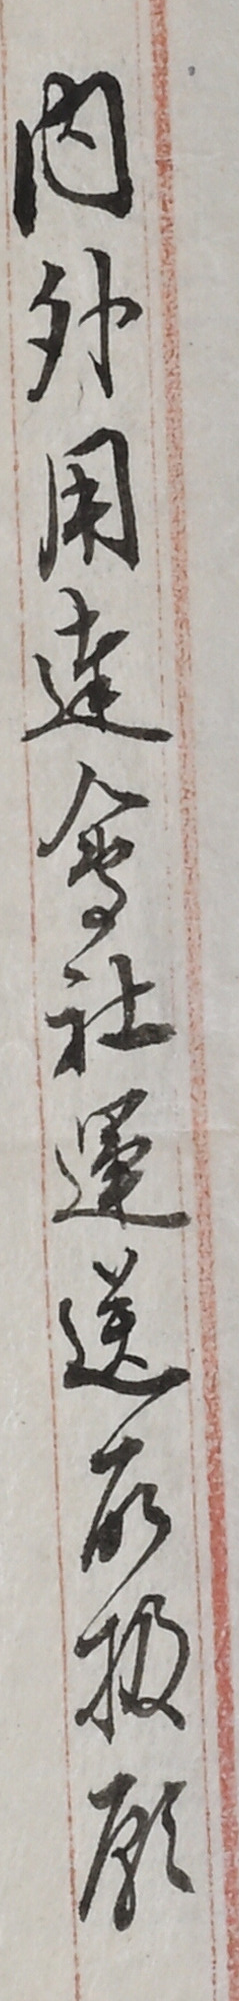内外用達会社運送取扱願
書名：郡役所勤務中御用抜書
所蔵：伊那市立高遠町図書館・合同会社AMANE
